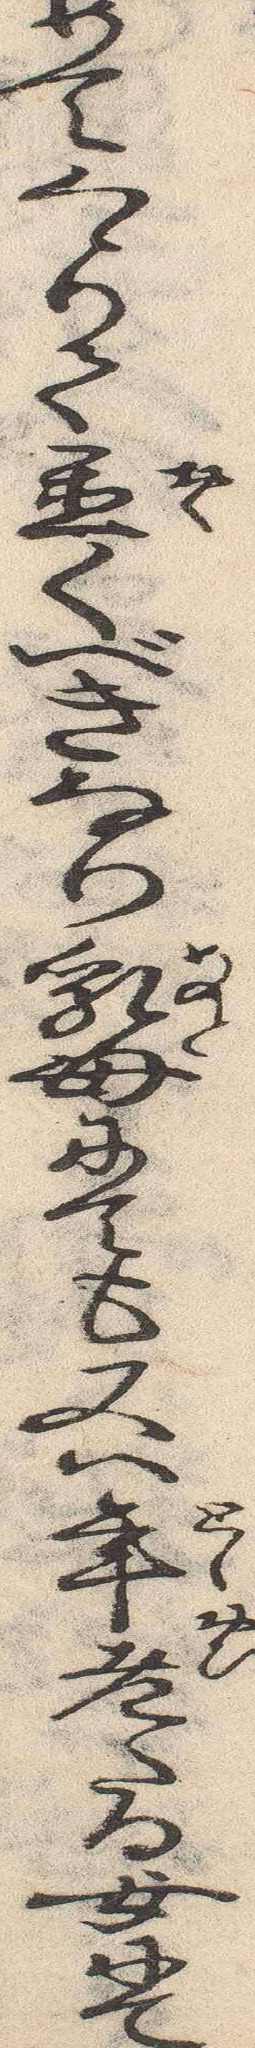めてくゝりて置くべきなり乳母にても又は年老たる女にて
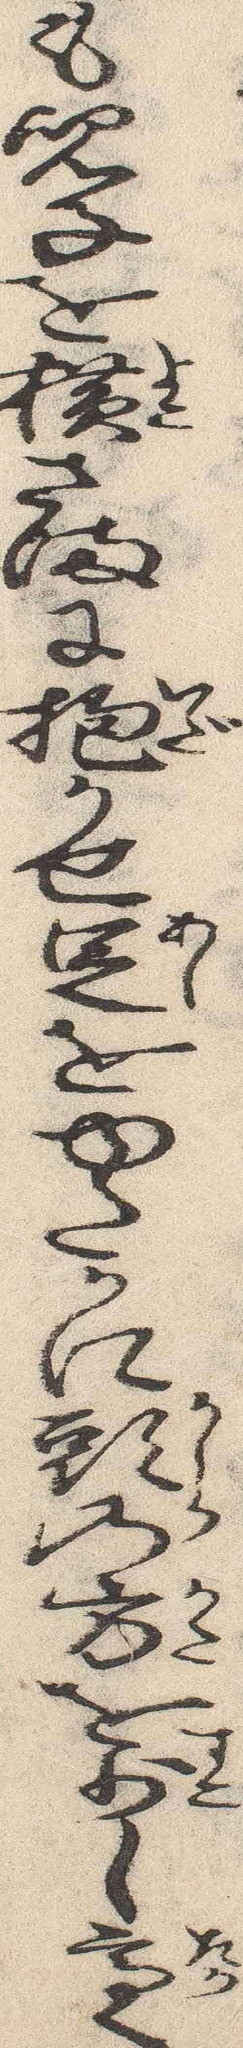も児子を横さまに抱かせ足をゆたかに頭の方を少し高く
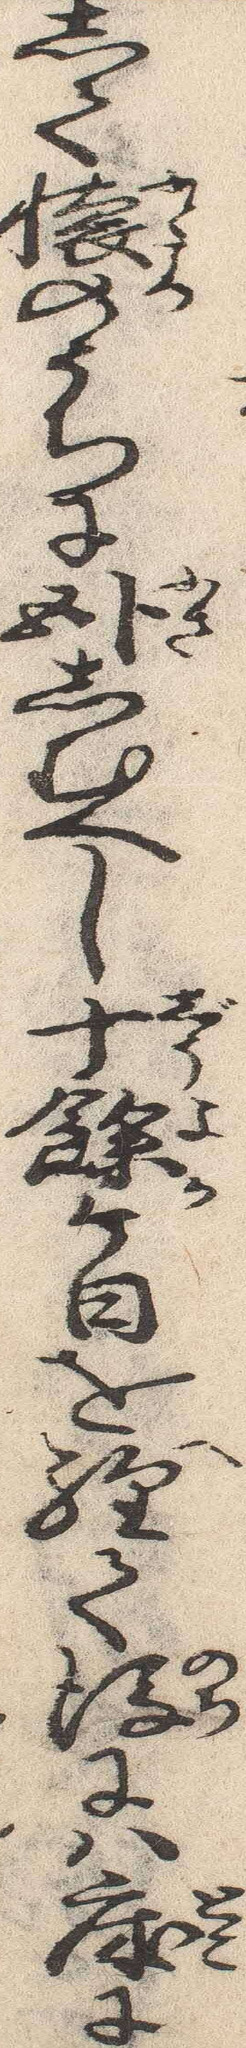して懐のうちに臥しむへし十餘ケ日を経て後には床に
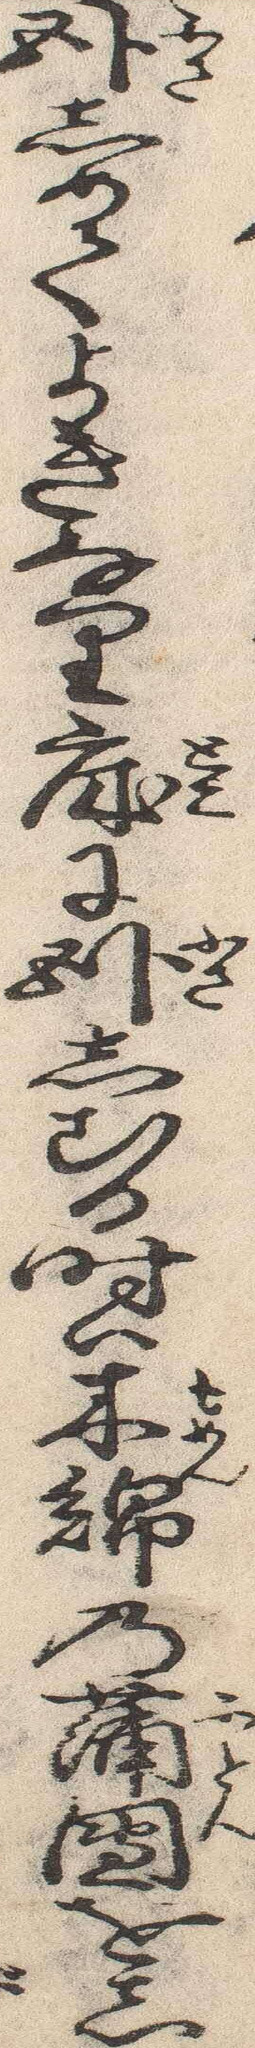臥しめてよきなり床に臥しむる時は木綿の蒲團をし
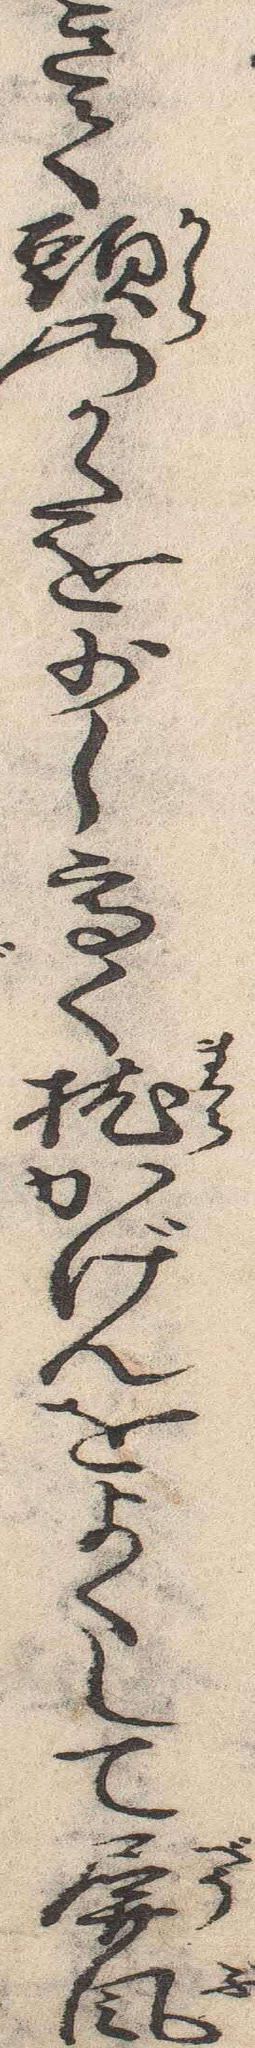きて頭のかたを少し高く枕かげんをよくして屏風
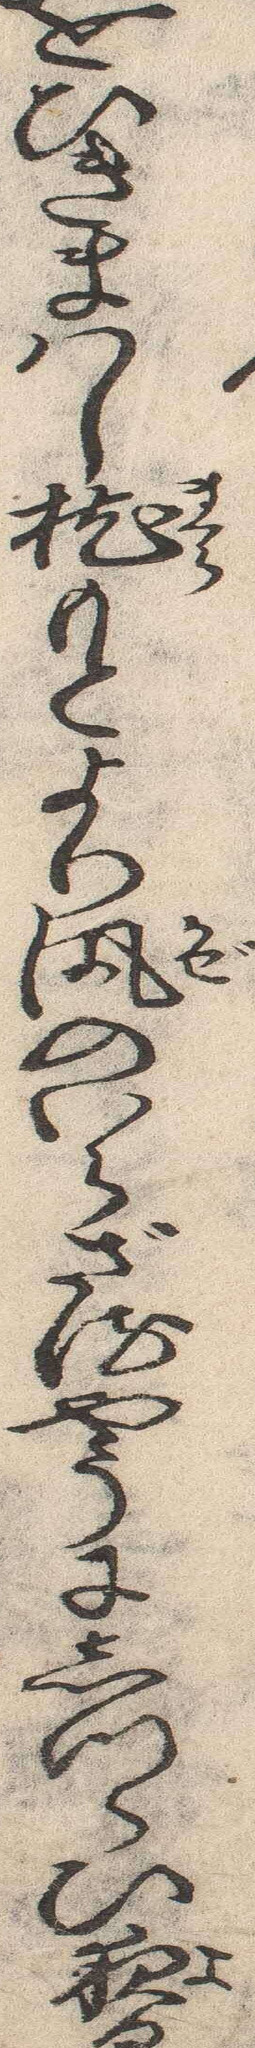をひきまはし枕もとより風のいらざるやうにしつらひ夜る
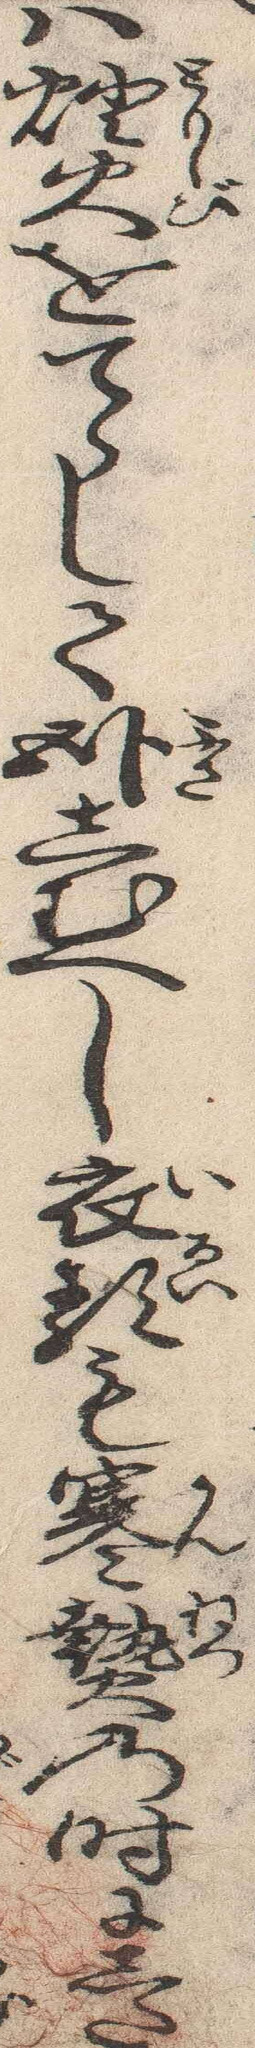は燈火をてらして臥しむへし衣類も寒𤍽の時にした
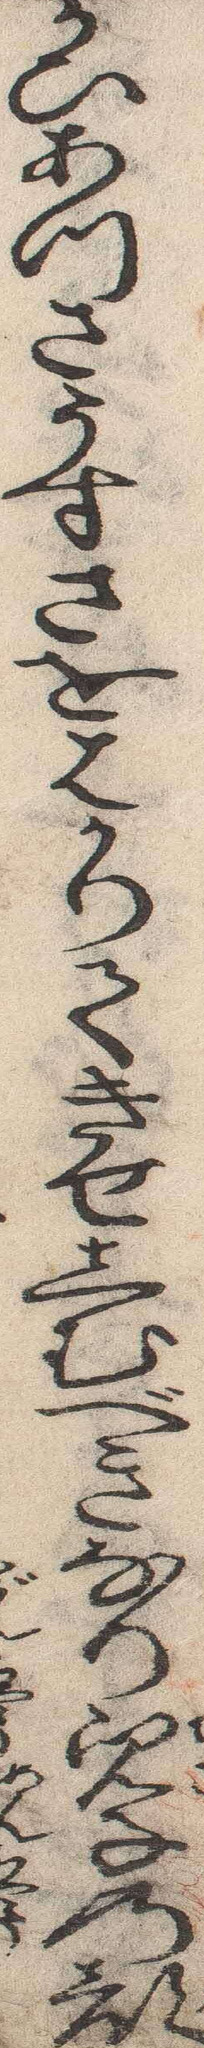かひあつさうすさをはかりてきせしむべきなり児子の顔
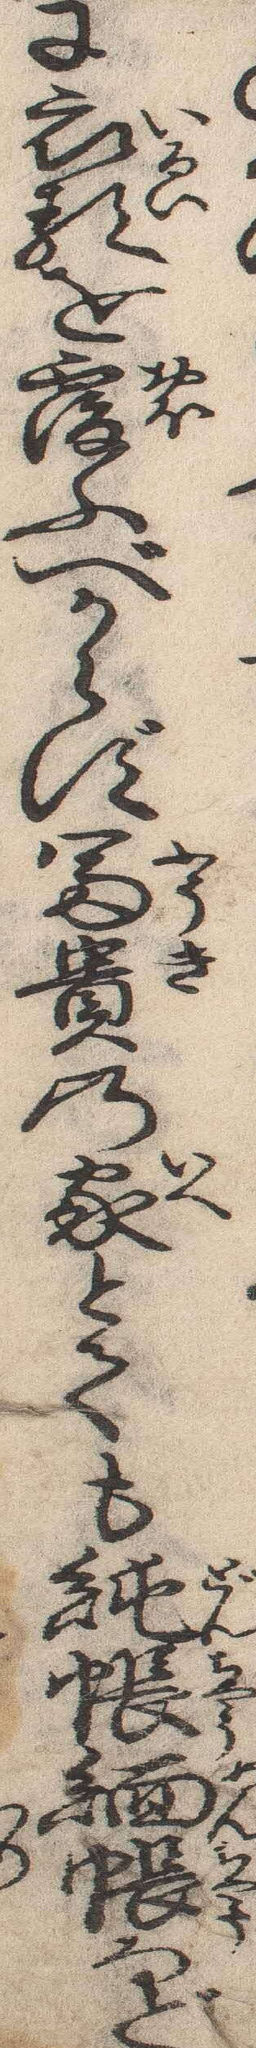に衣類を覆ふべからず富貴の家とても純帳緬帳など
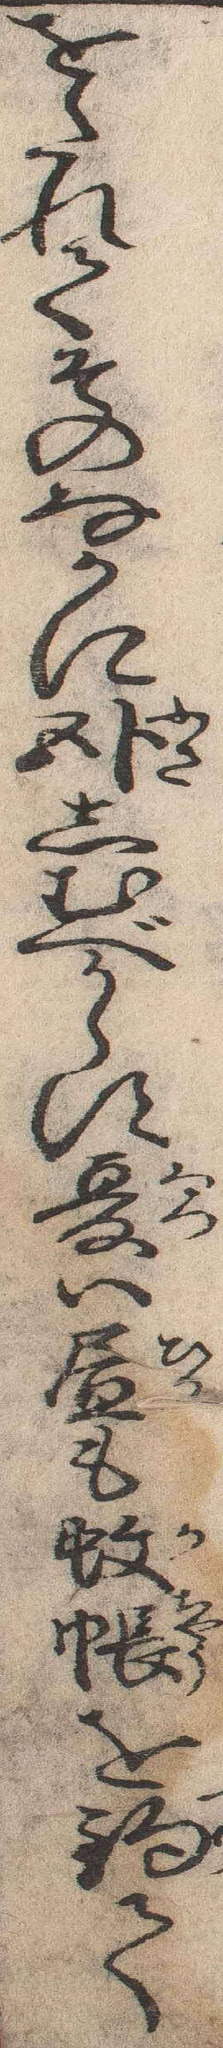をたれてそのなかに臥しむべからす夏は昼も蚊帳を釣て

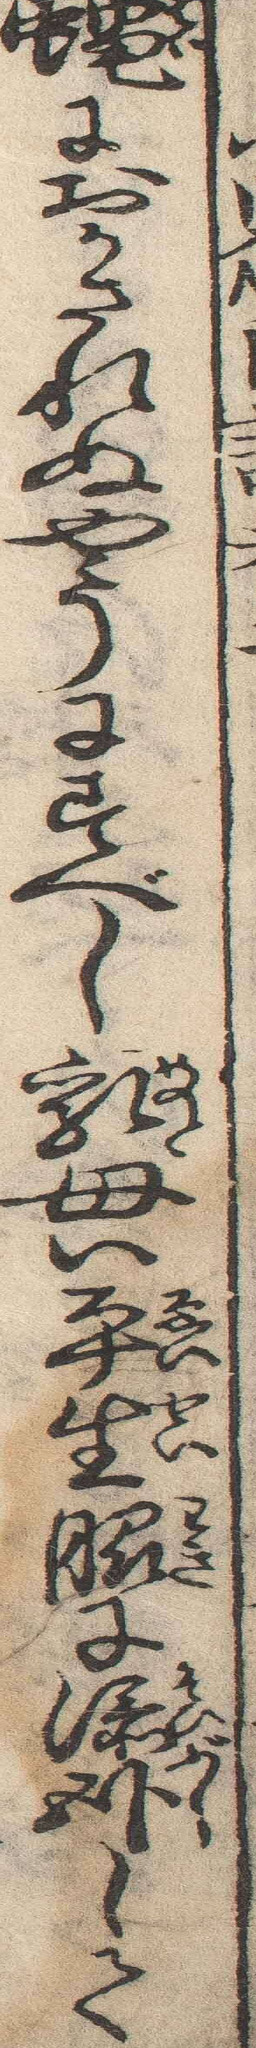蝿におかされぬやうにすべし乳母は平生脇に添臥して
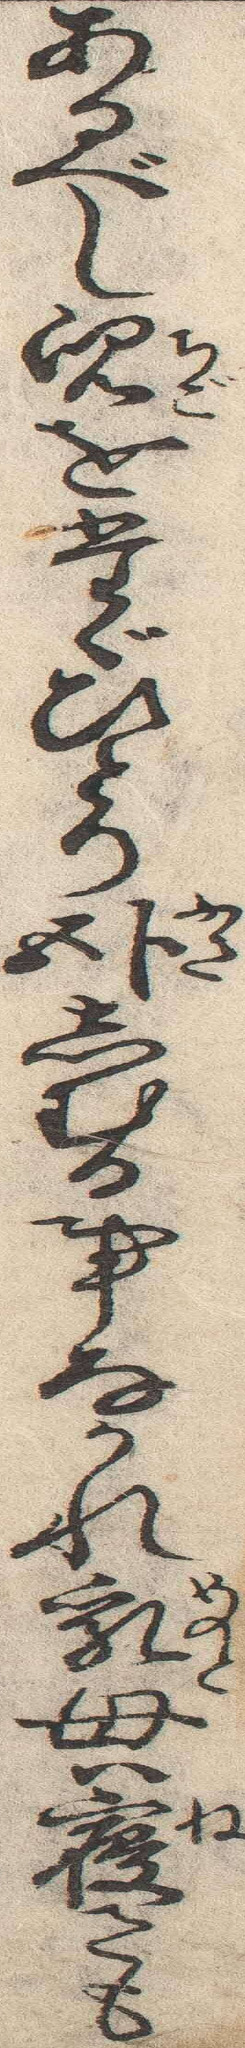あるべし児をたゞひとり臥しむる事なかれ乳母は寝ても
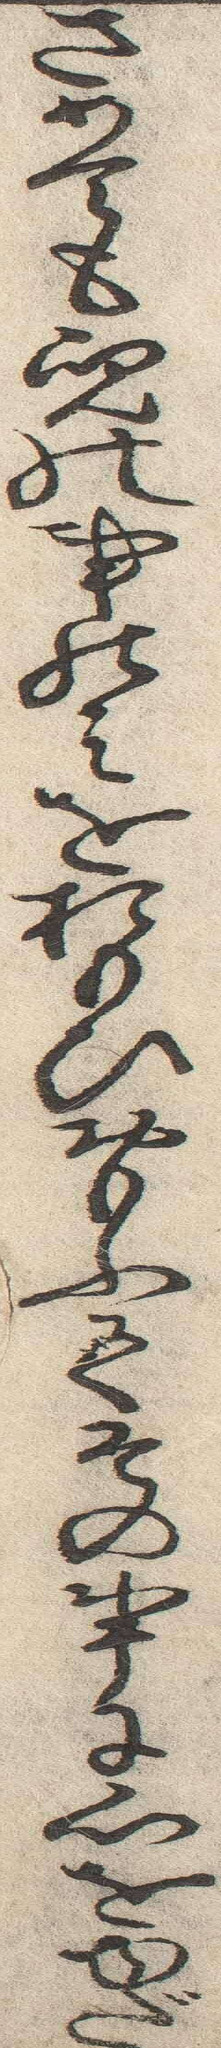さめても児の事のみをおもひおもふてその半に心をゆだ
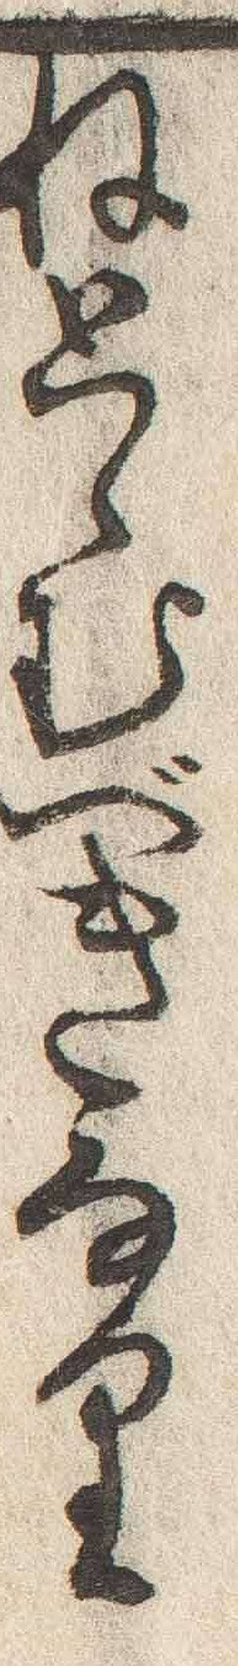ねとゝむべきなり
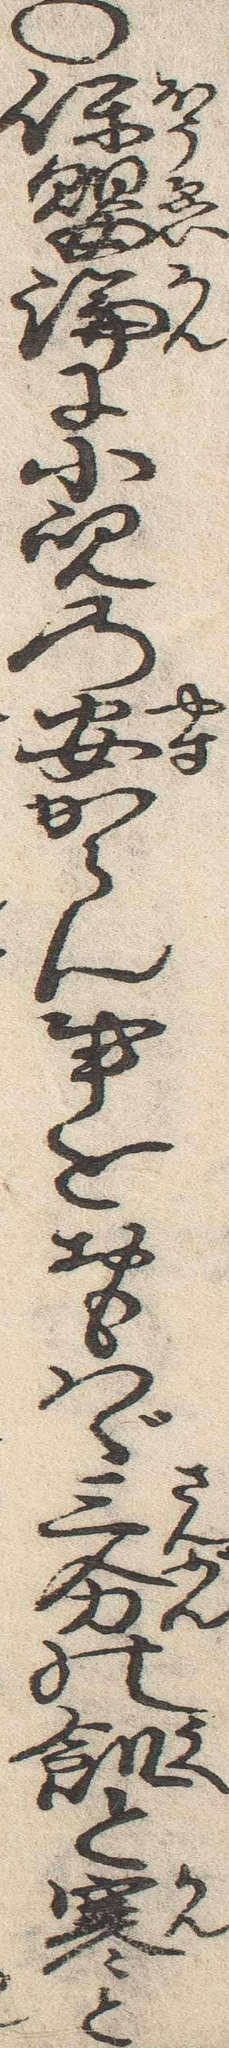◯保嬰論に小児の安からん事をおもはゞ三分の飢と寒と
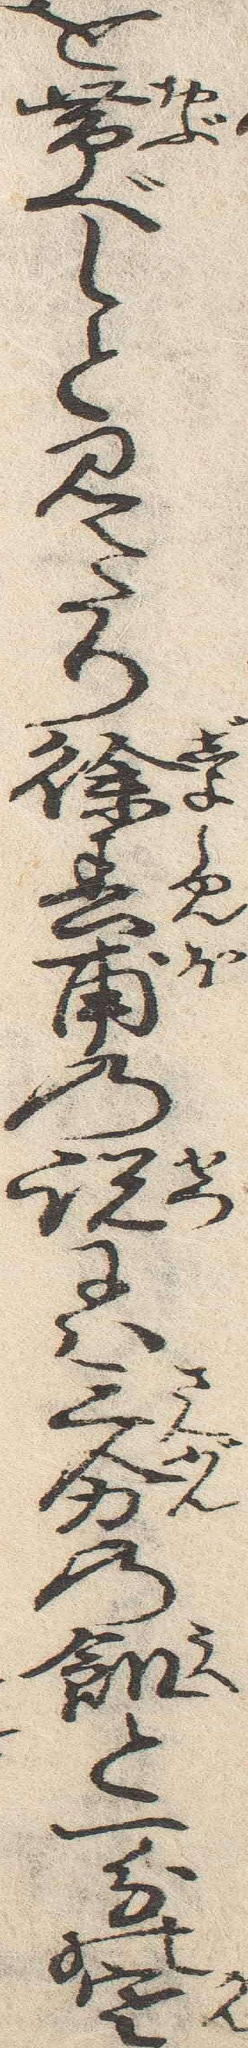を帯べしと見えたり徐春甫の説には三分の飢と一分の寒
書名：小児必用養育草
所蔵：東京学芸大学附属図書館 国文学研究資料館
